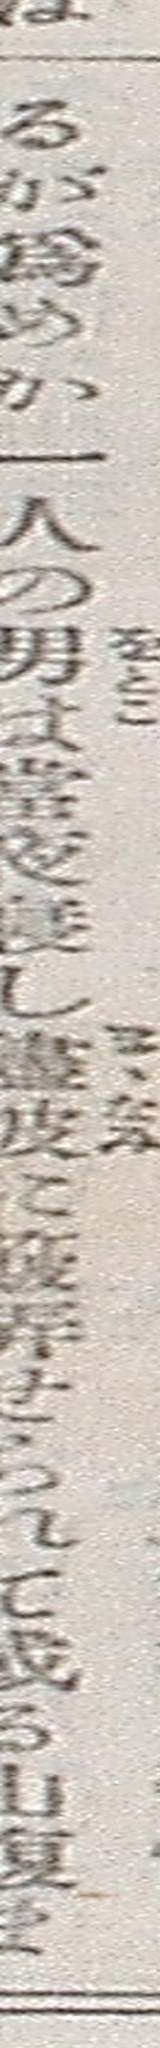るが為めか一人の男は当夜寝し侭波に簸弄せられて或る山腹ま
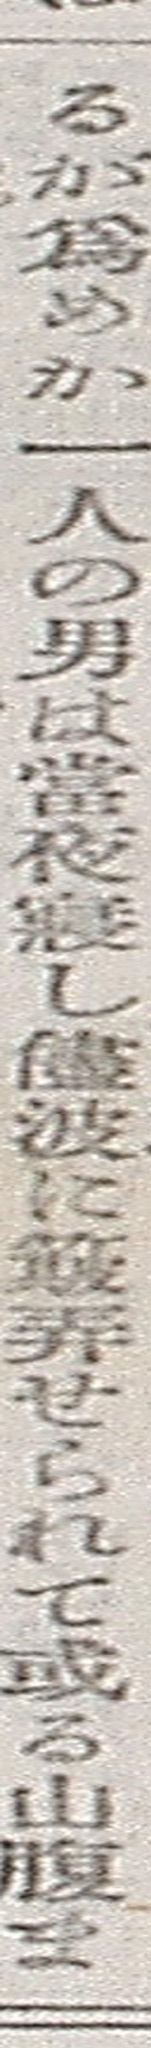るが為めか一人の男は当夜寝し侭波に簸弄せられて或る山腹ま
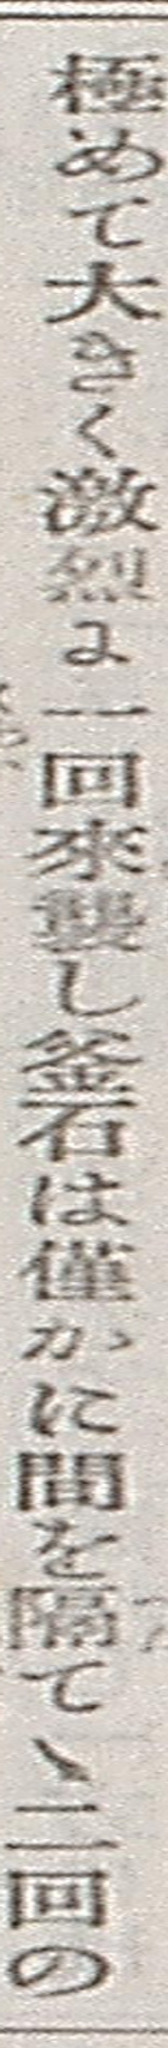極めて大きく激烈に一回来襲し釜石は僅かに間を隔てゝ二回の
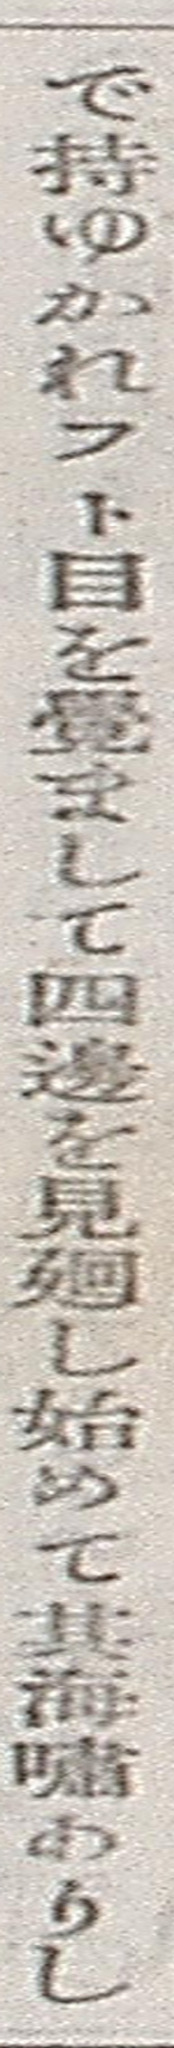で持ゆかれフト目を覚まして四辺を見廻し始めて其海嘯ありし
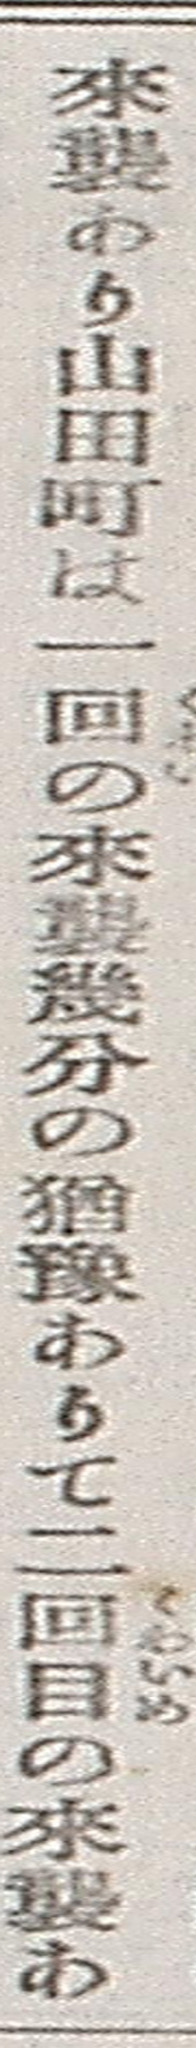来襲あり山田町は一回の来襲幾分の猶予ありて二回目の来襲あ
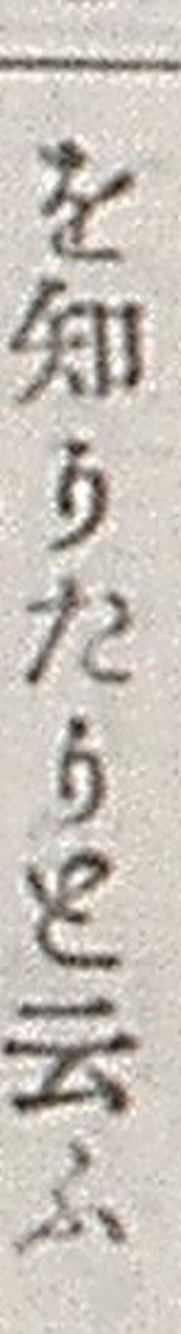を知りたりと云ふ
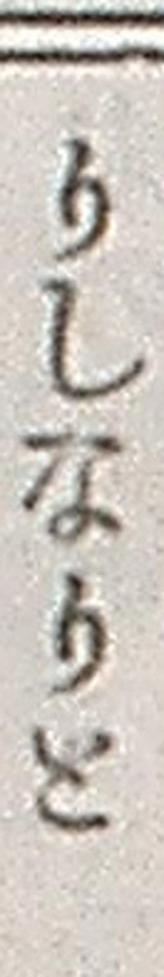りしなりと
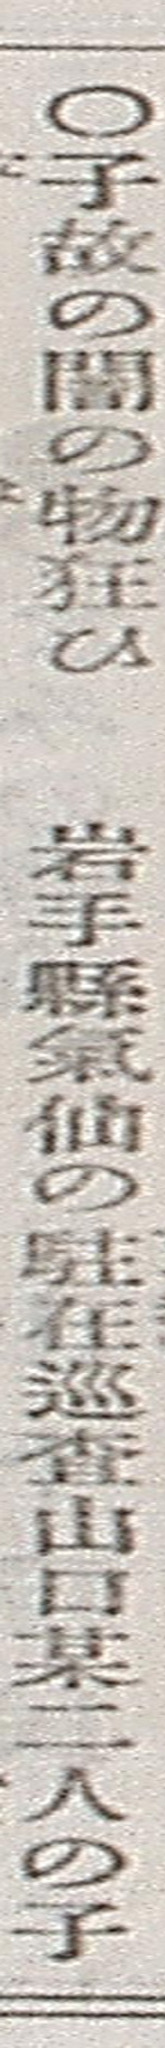○子故の闇の物狂ひ岩手県気仙の駐在巡査山口某二人の子
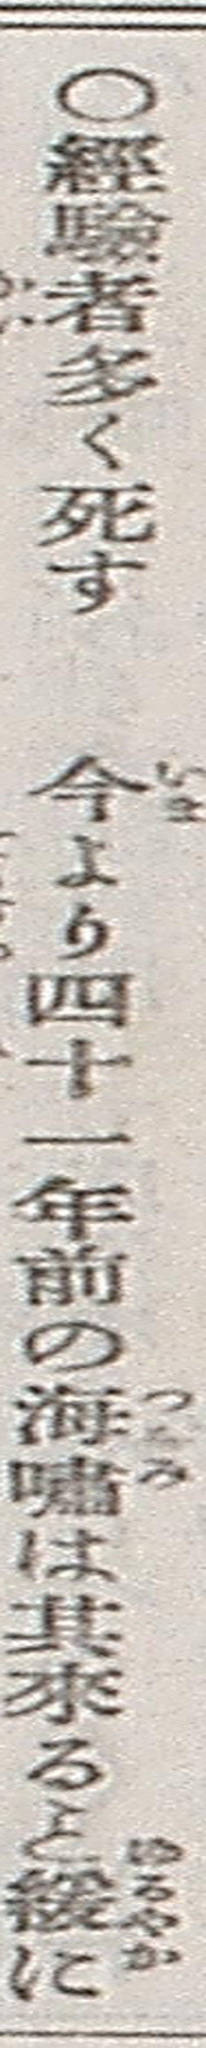○経験者多く死す今より四十一年前の海嘯は其来ること緩に
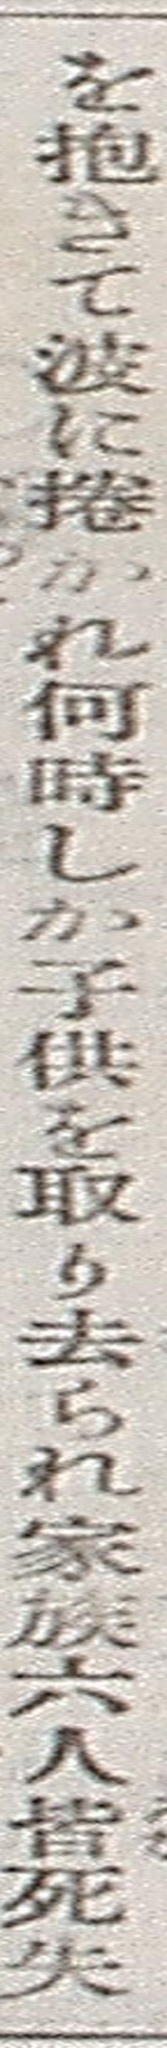を抱きて波に捲かれ何時しか子供を取り去られ家族六人皆死失
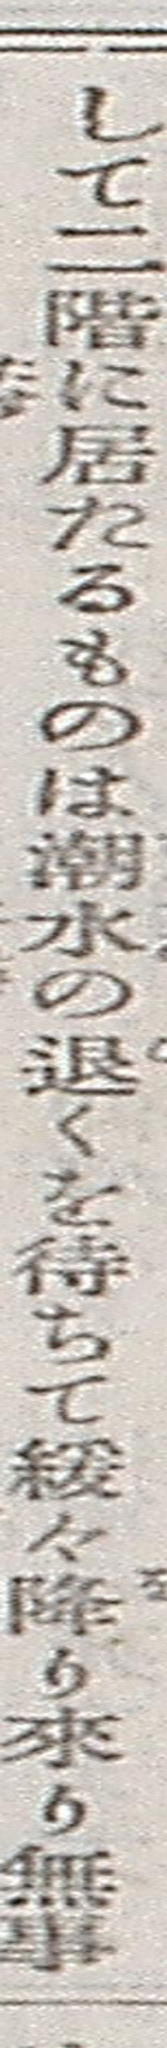して二階に居たるものは潮水の退くを待ちて緩々降り来り無事
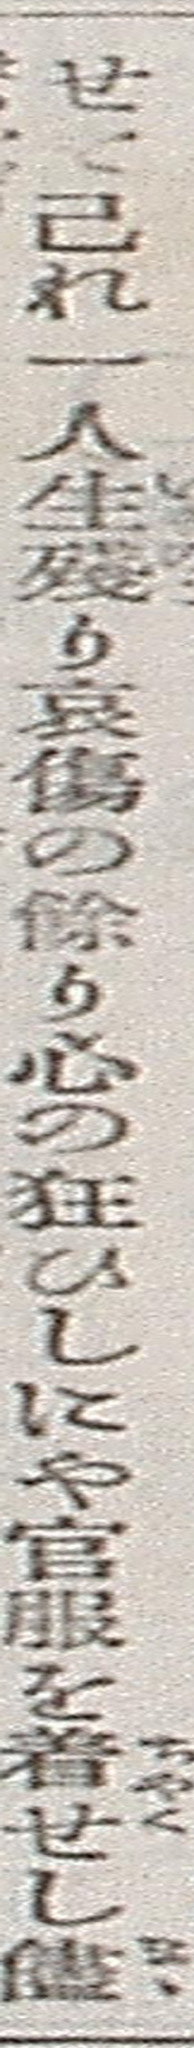せて己れ一人生残り哀傷の余り心の狂ひしにや官服を着せし侭
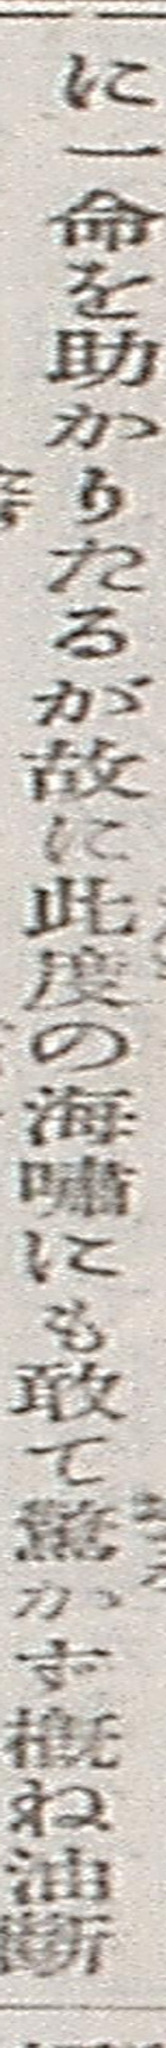に一命を助かりたるが故に此度の海嘯にも敢て驚かず概ね油断
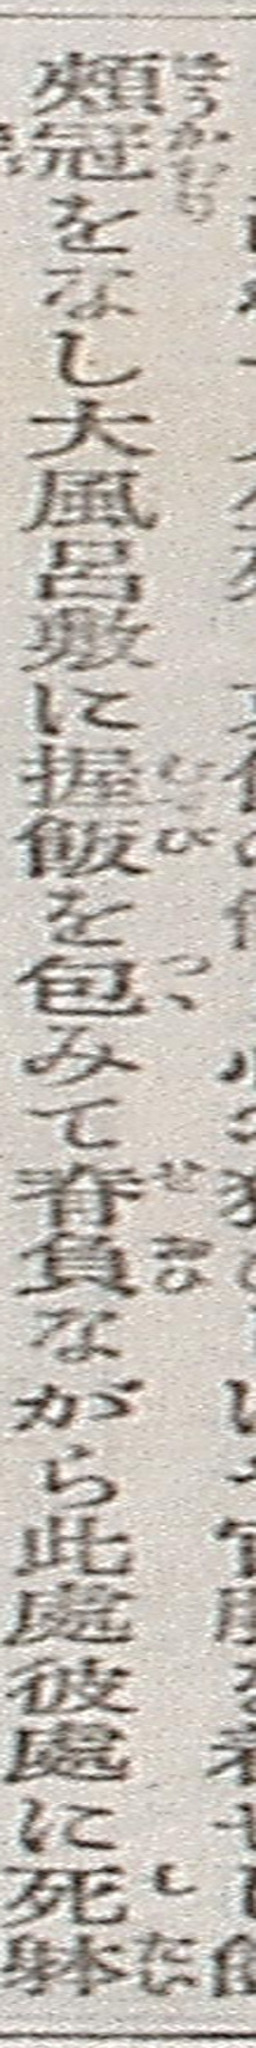頬冠をなし大風呂敷に握飯を包みて背負ながら此処彼処に死体
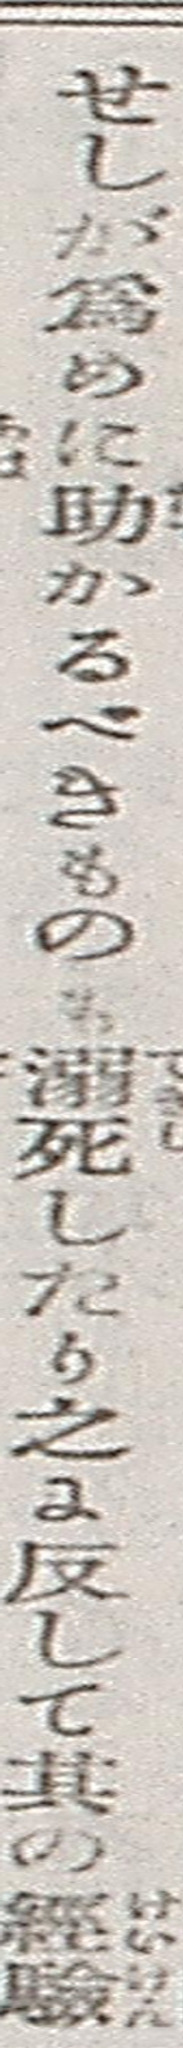せしが為めに助かるべきものも溺死したり之に反して其の経験
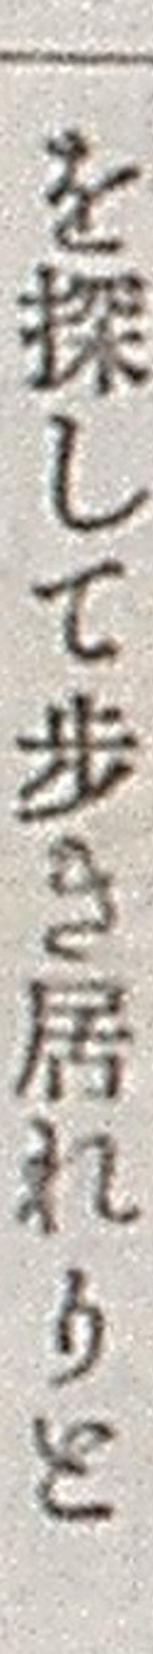を探して歩き居れりと
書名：風俗畫報臨時増刊第百二十號　大海嘯被害録（下）
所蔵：東京大学地震研究所図書室 Earthquake Research Institute Library, The University of Tokyo, JAPAN
